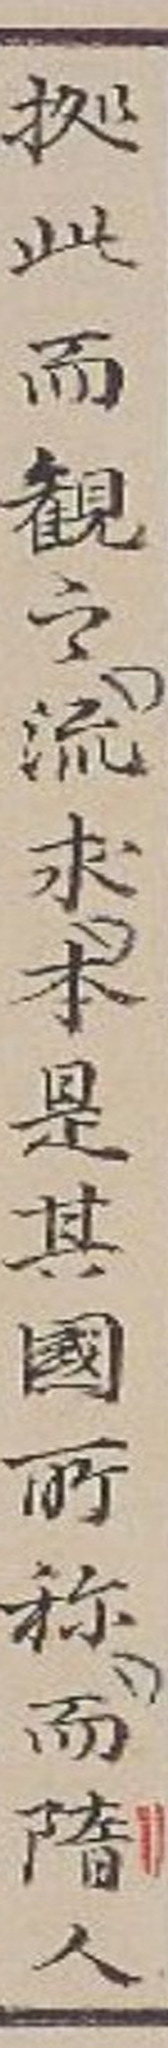拠此而観之。流求。本是其國所称。而隋人
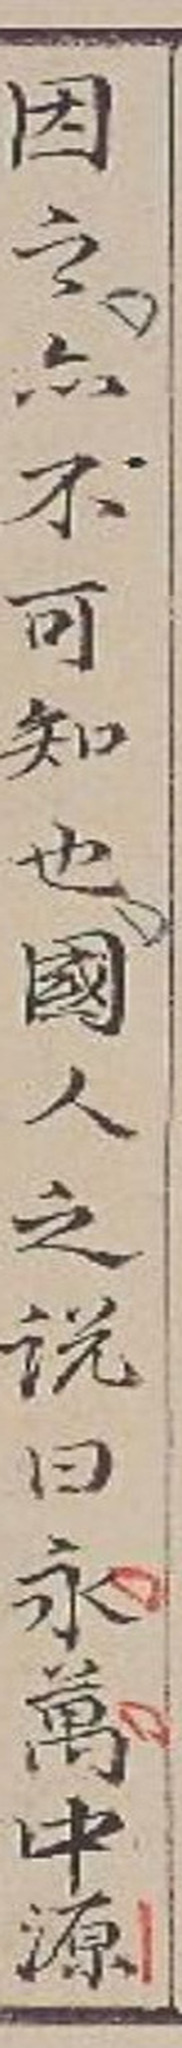因之。亦不可知也。国人之説曰永万中源
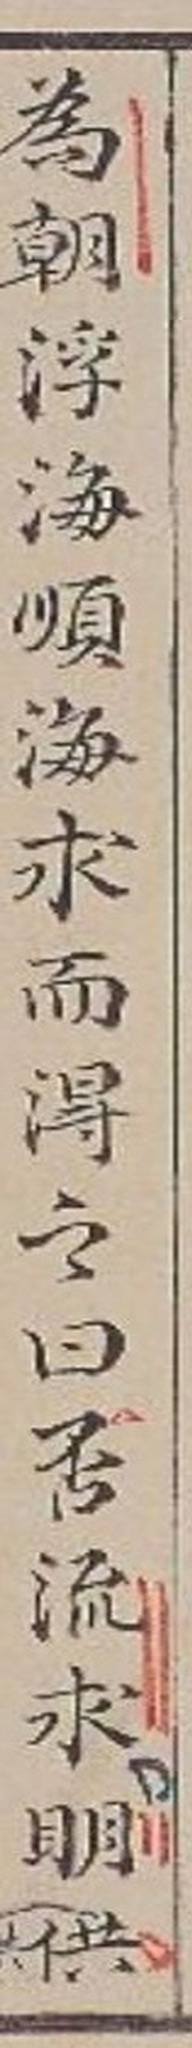為朝浮海順海求而淂之曰否流求。眀供洪
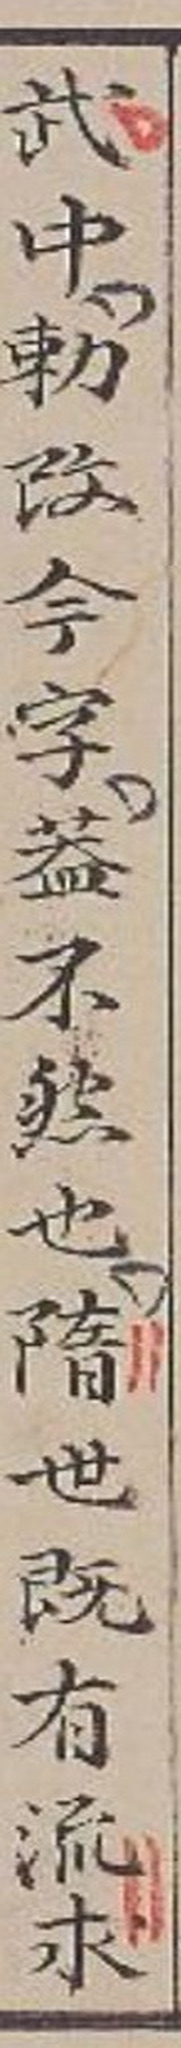武中。勅改今字。蓋不然也。隋世既有流求
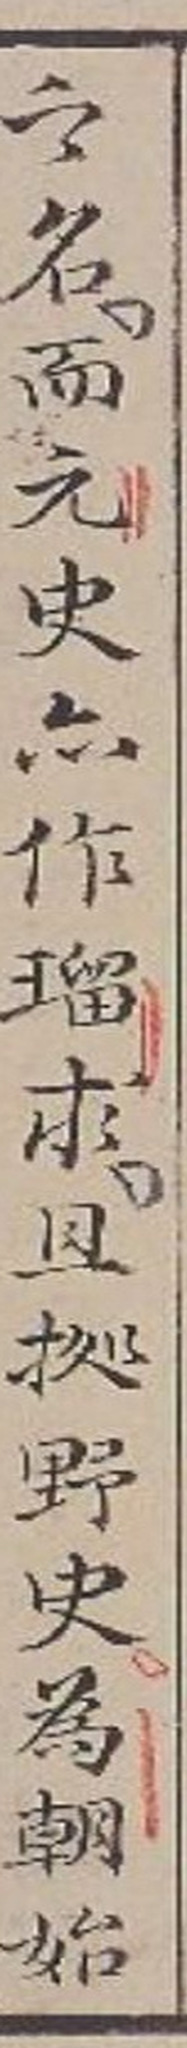之名。而元史亦作瑠求。且拠野史。為朝始

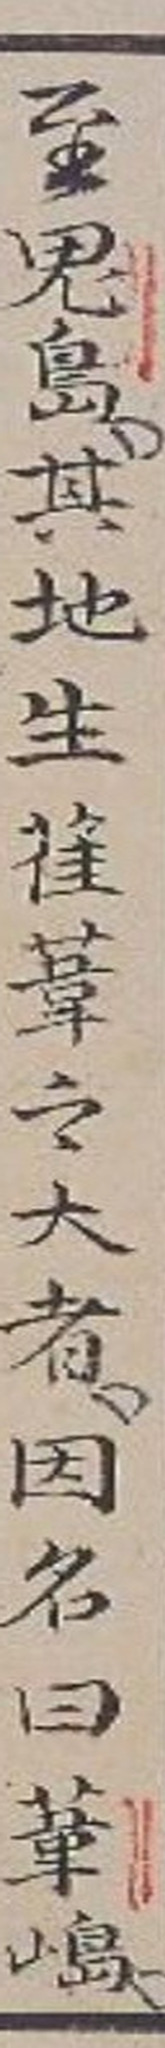至鬼島。其地生萑葦之大者。因名曰葦島。
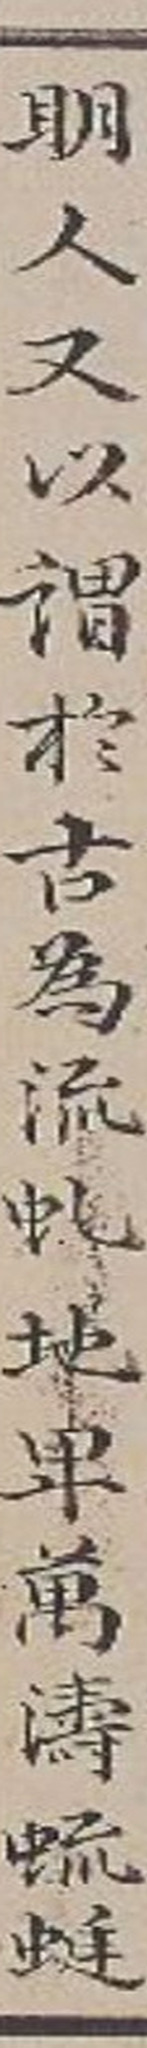眀人又以謂於古為流虬地卑万濤䖻蜒
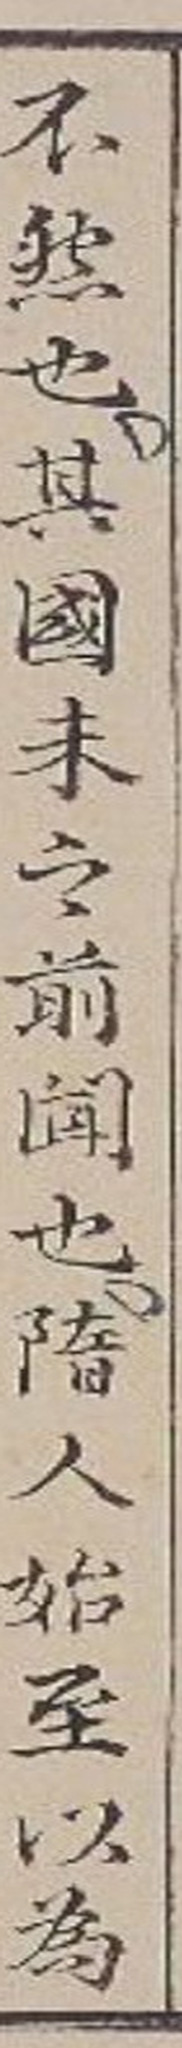不然也。其国未之前聞也。隋人始至以爲
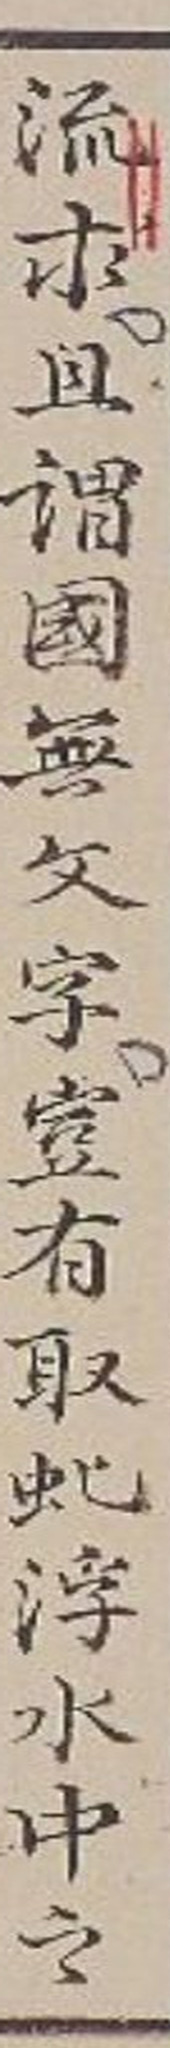流求。且謂国無文字。豈有取虬浮水中之
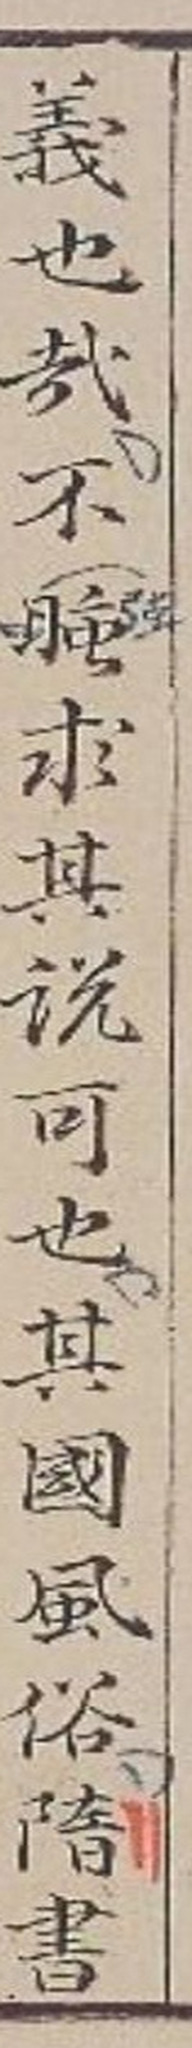義也哉。不強求其説可也。其国風俗。隋書
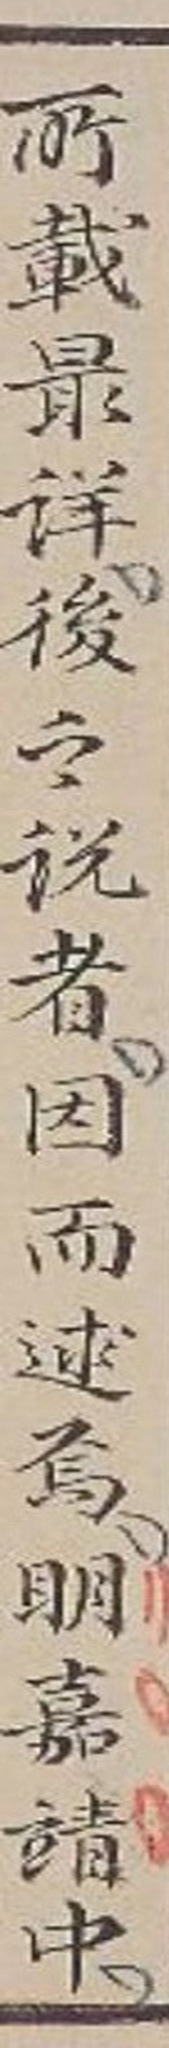所載最詳。後之説者。因而述焉。眀嘉靖中。
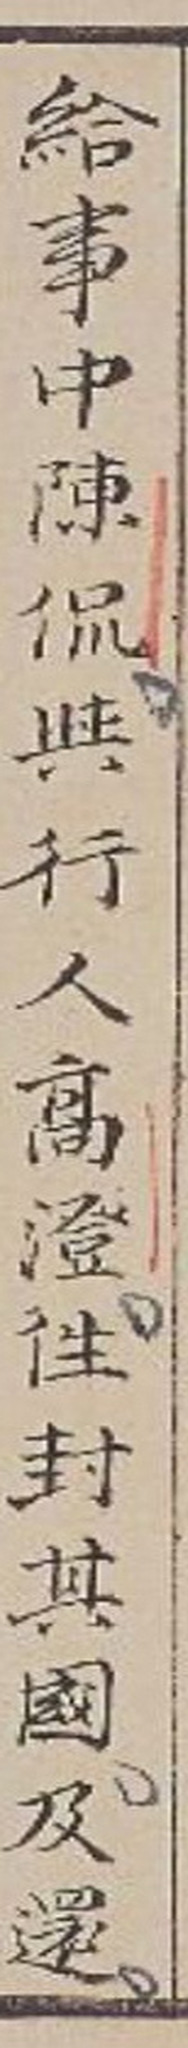給事中陳侃。与行人高澄。往封其国。及還。
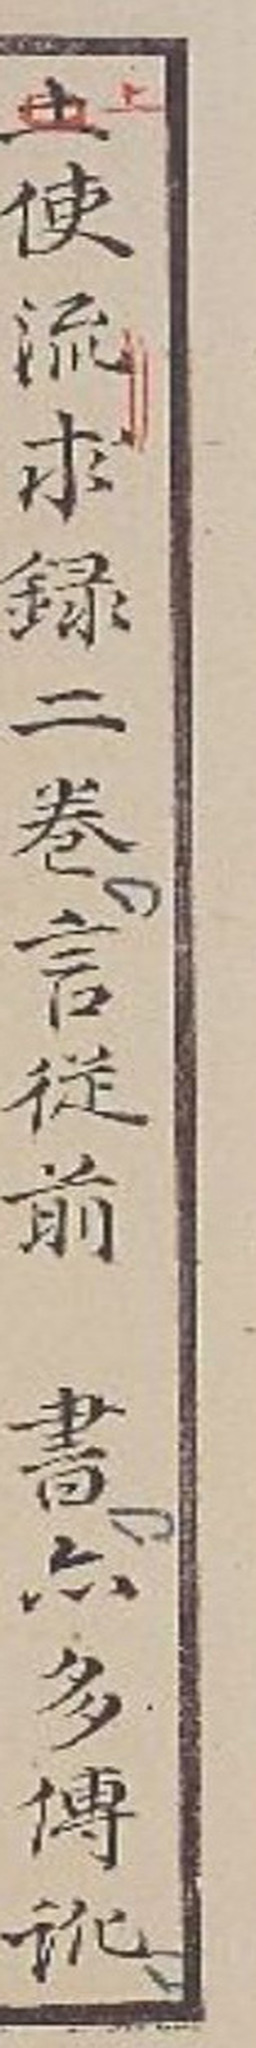土上使流求録二巻。言従前書。亦多伝訛。
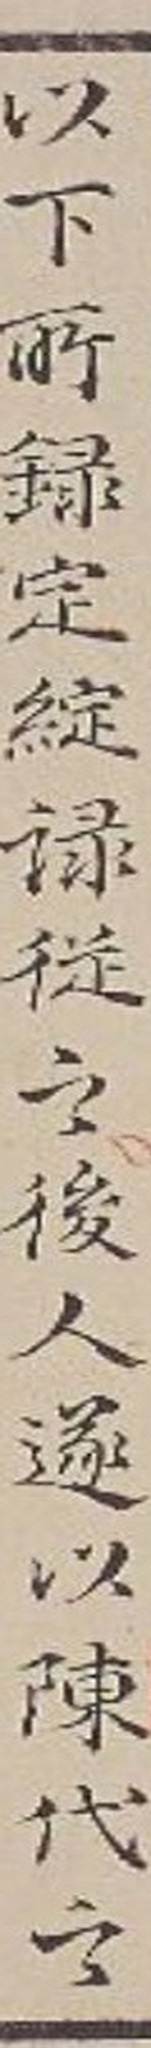以下所録定綻録従之。後人遂以陳代之
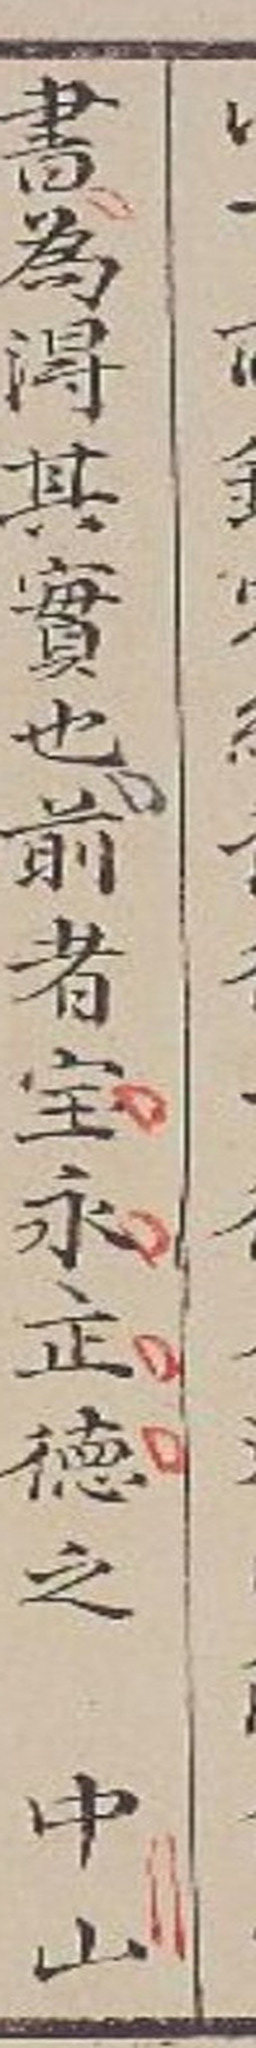書。為淂其実也。前者宝永、正徳之中山
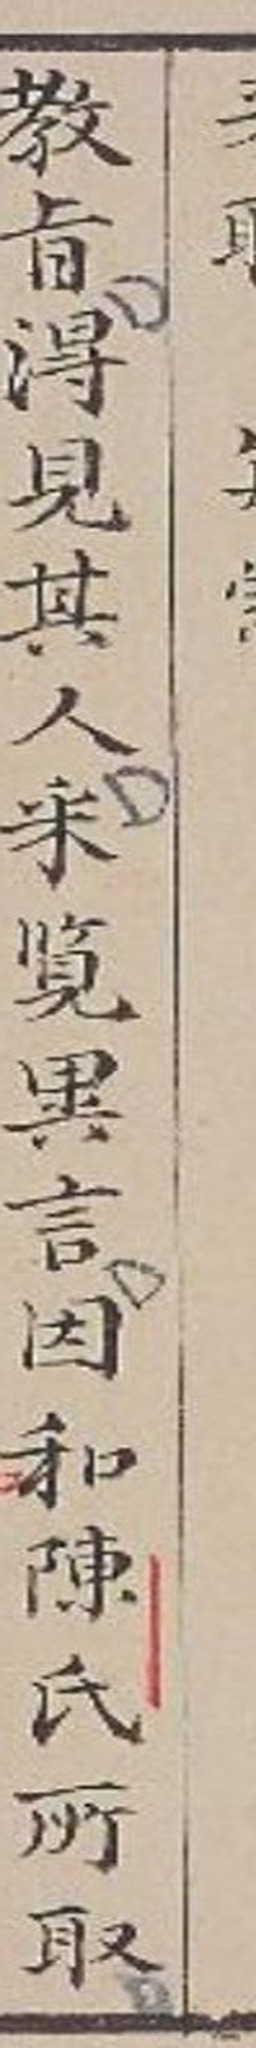教旨。淂見其人。釆覧異言。因和知陳氏所取。
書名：南島志 全
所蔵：University of the Ryukyus Library
